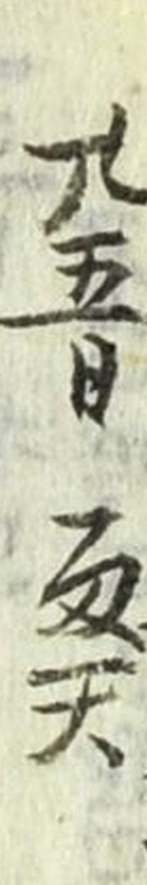廿五日雨天
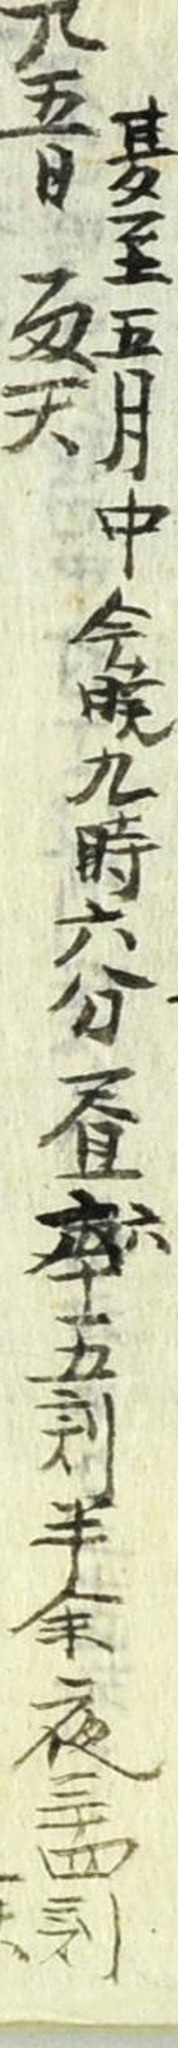夏至五月中今暁九時六分昼六十五刻半余夜三十四刻余
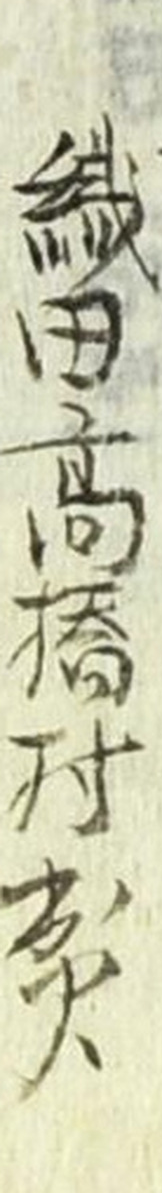織田高橋村出火
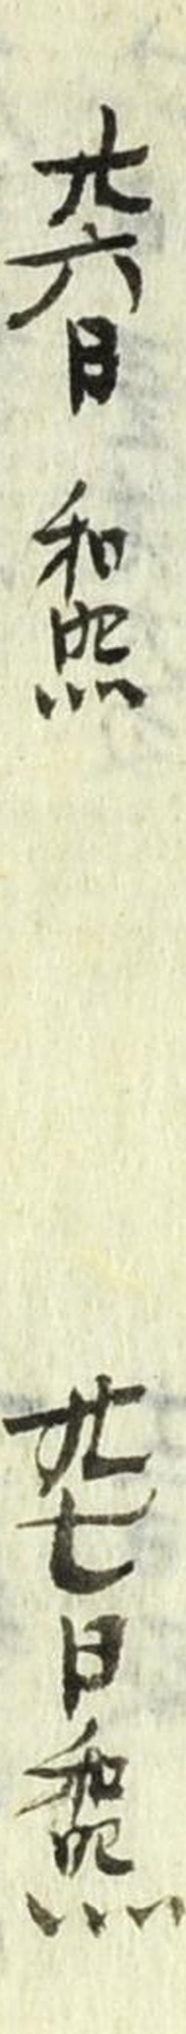廿六日和照廿七日和照
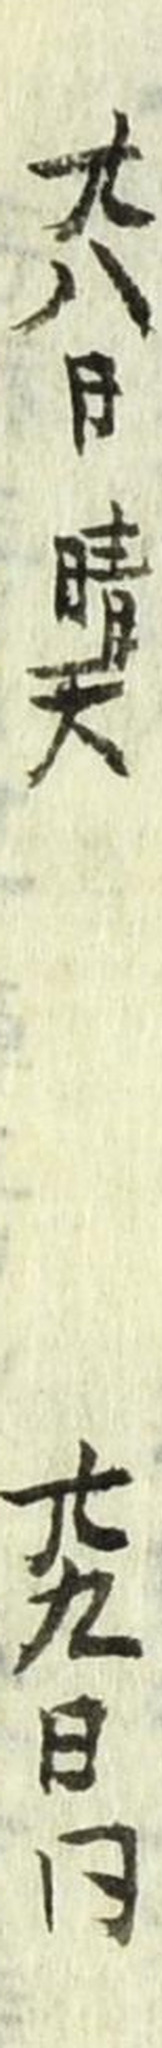廿八日晴天廿九日同
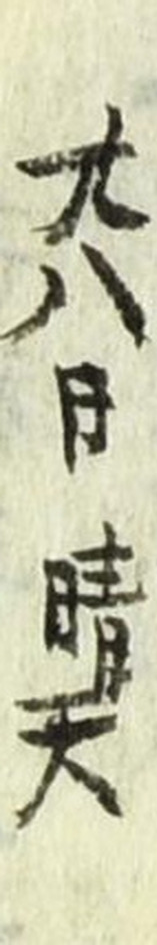廿五日雨天
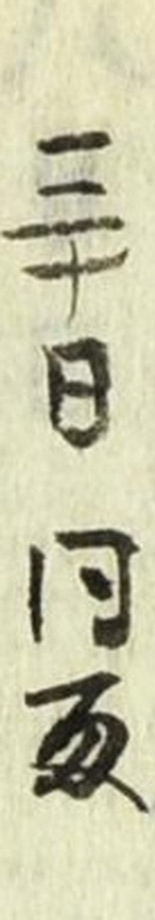三十日同雨
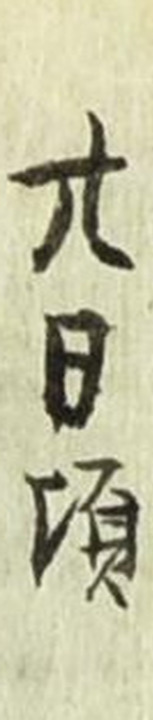廿日頃

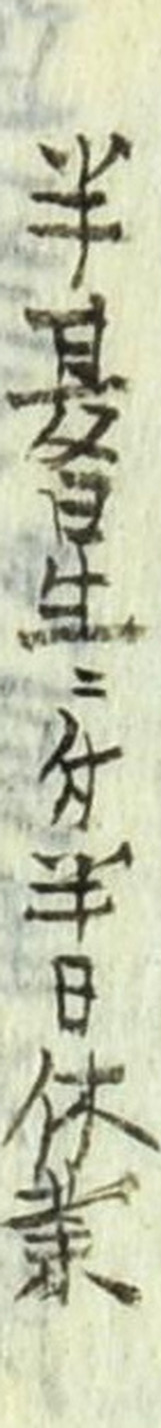半夏星ニ付半日休業
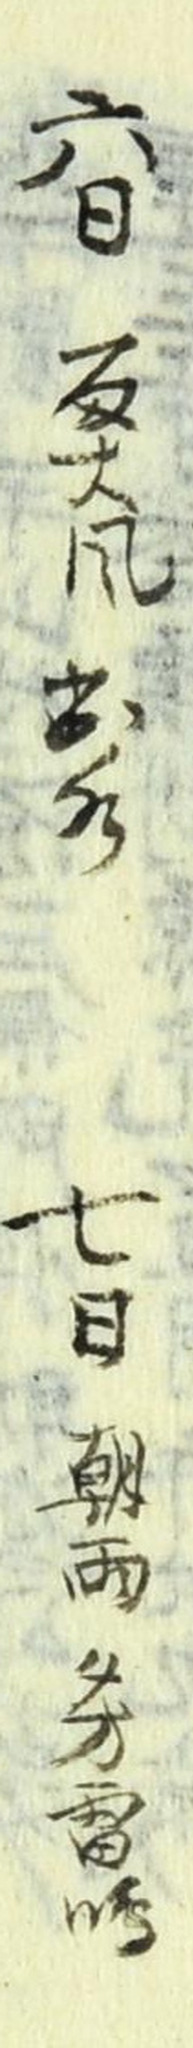六日雨大風出水七日朝雨夕方雷鳴
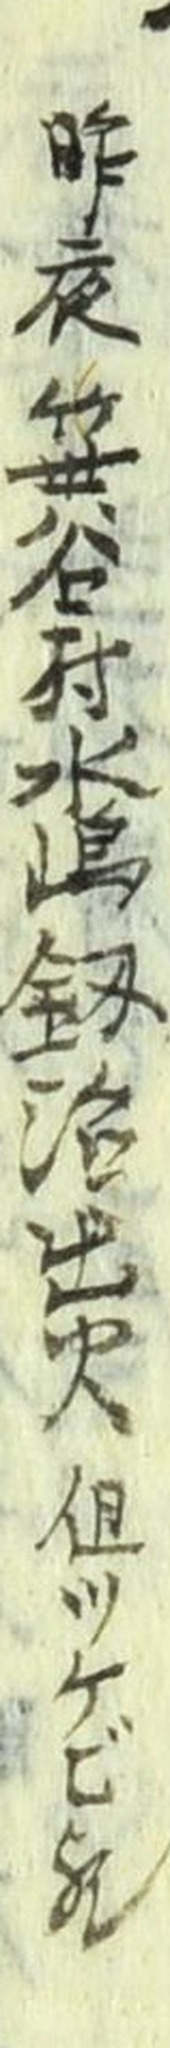昨夜笹谷村水島剣冶出火但ツケビ歟
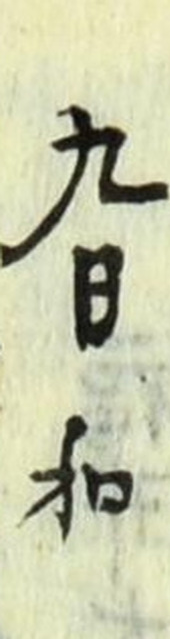九日和
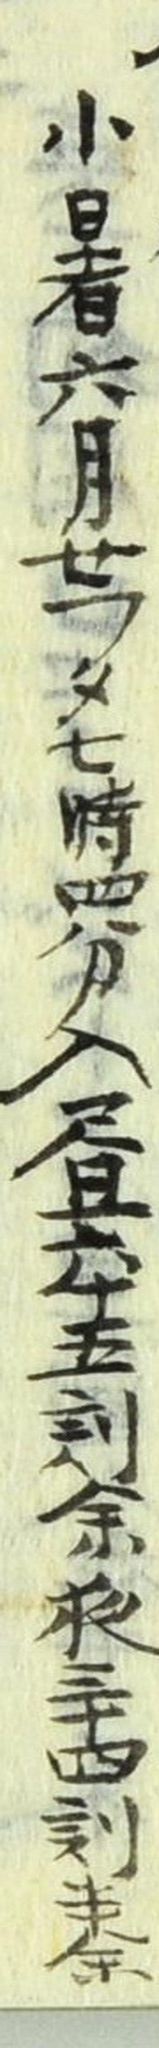小暑六月せつ夕七時四分入昼六十五刻余夜三十四刻半余
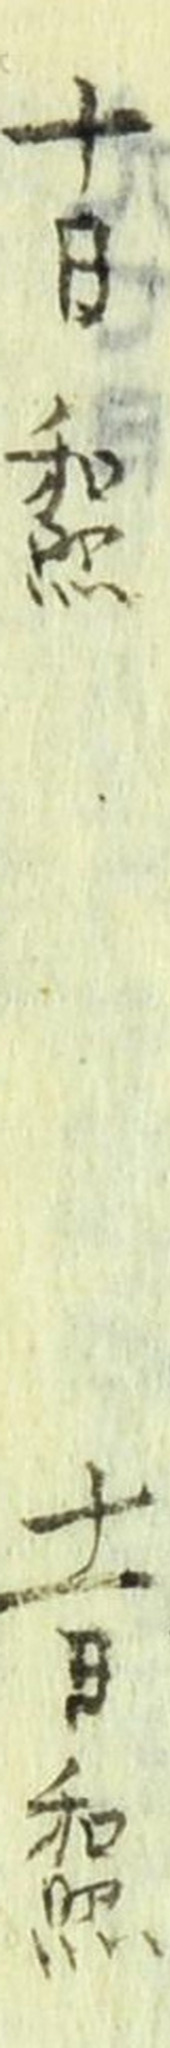十日和照十一日和照
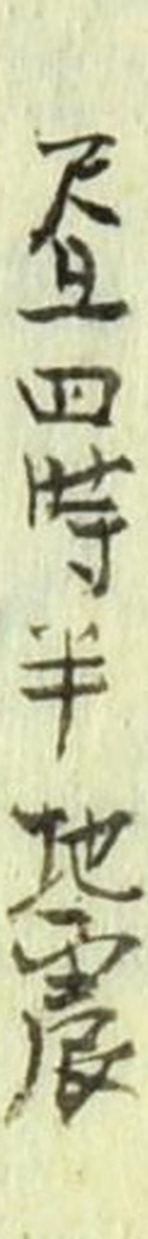昼四半時地震
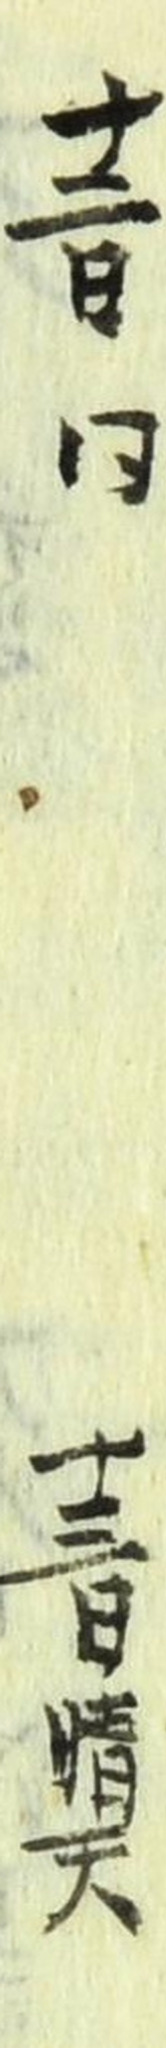十二日同十三日晴天
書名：（日記）
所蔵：福井県文書館 Fukui Prefectural Archives
